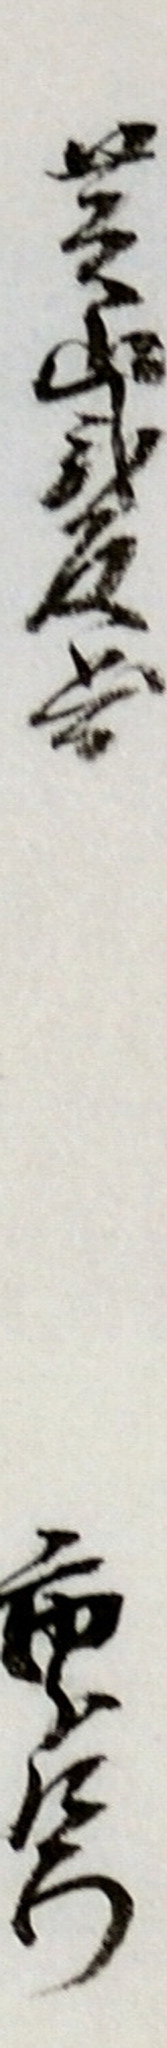芝山弐反歩市郎左衛門
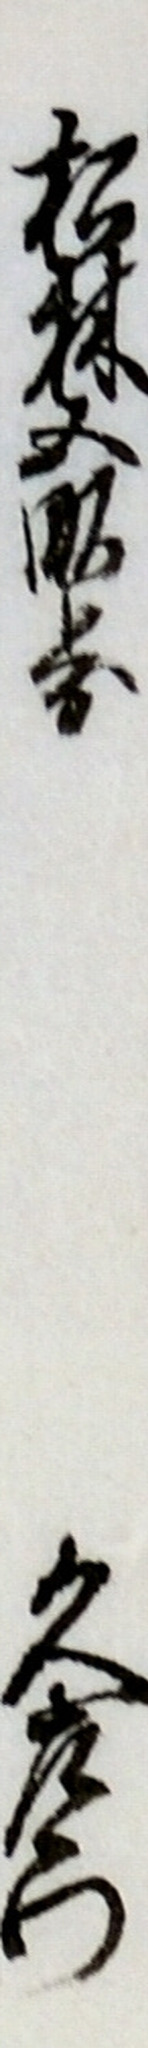松林五畝歩久左衛門
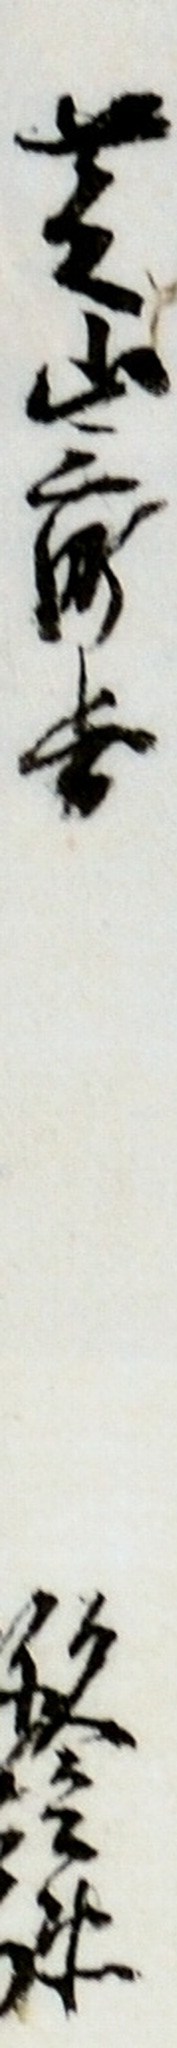芝山五畝拾歩久兵衛
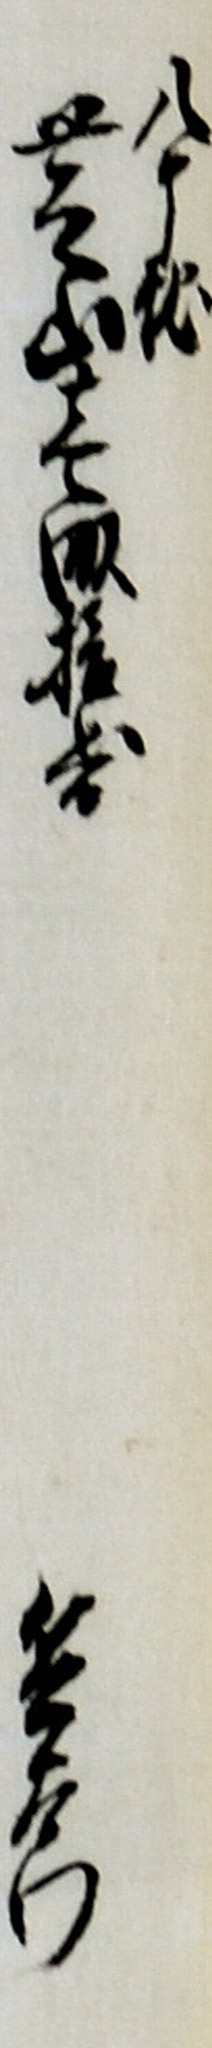芝山壱畝拾歩兵右衛門
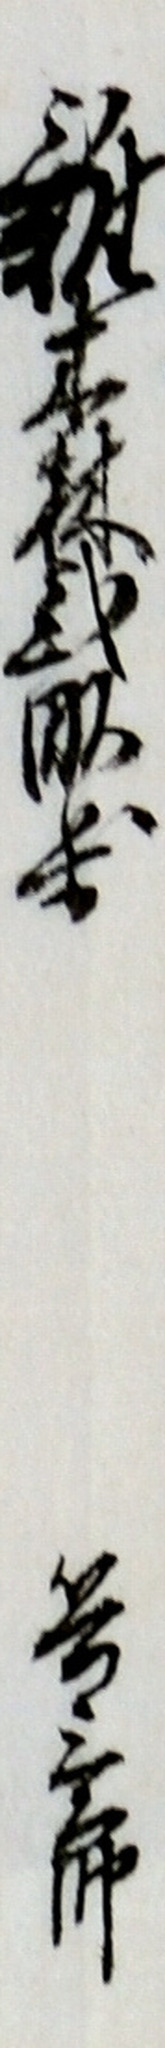雑木林弐畝歩兵三郎
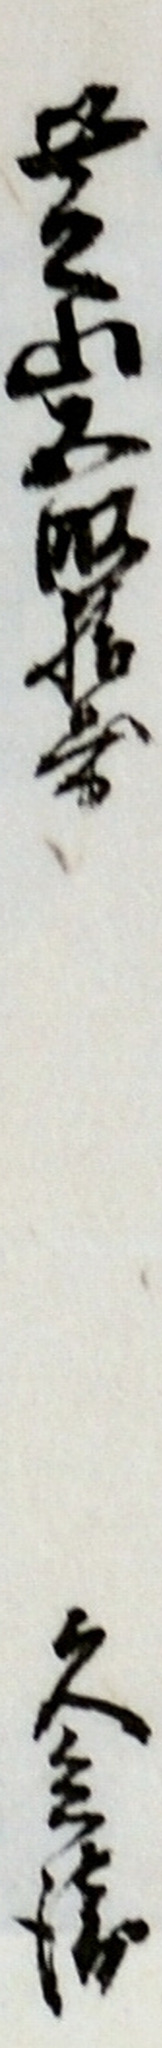芝山五畝拾歩久兵衛

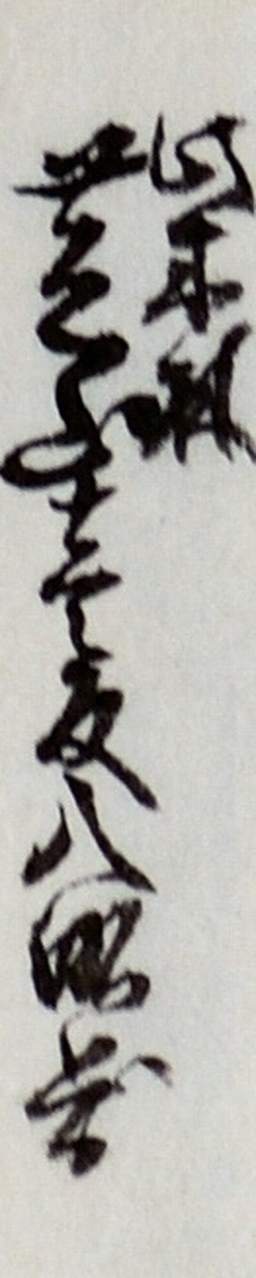芝山壱反八畝歩同人
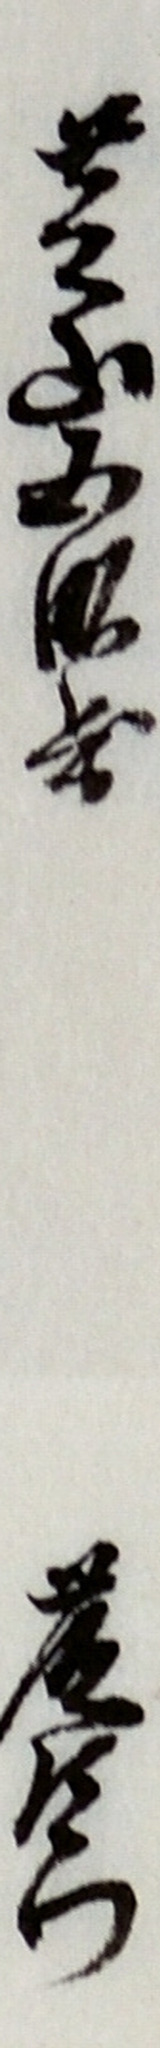芝山五畝歩藤左衛門
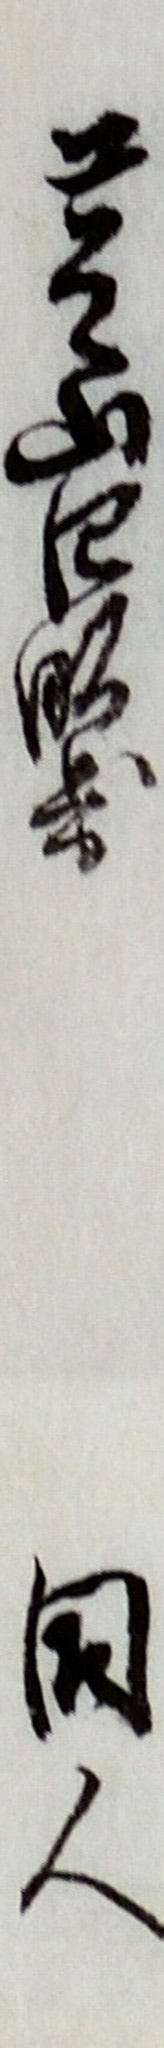芝山四畝歩同人

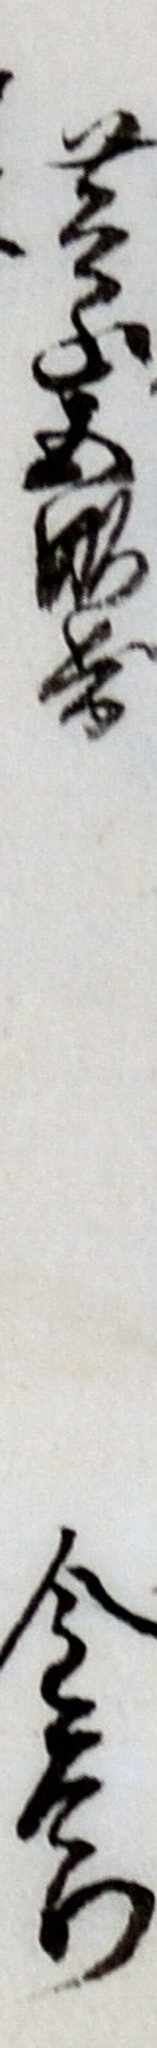芝山五畝歩金右衛門
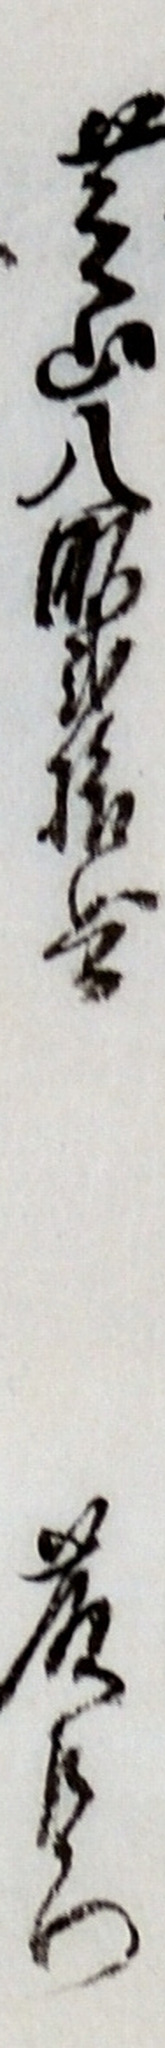芝山八畝弐拾歩藤左衛門

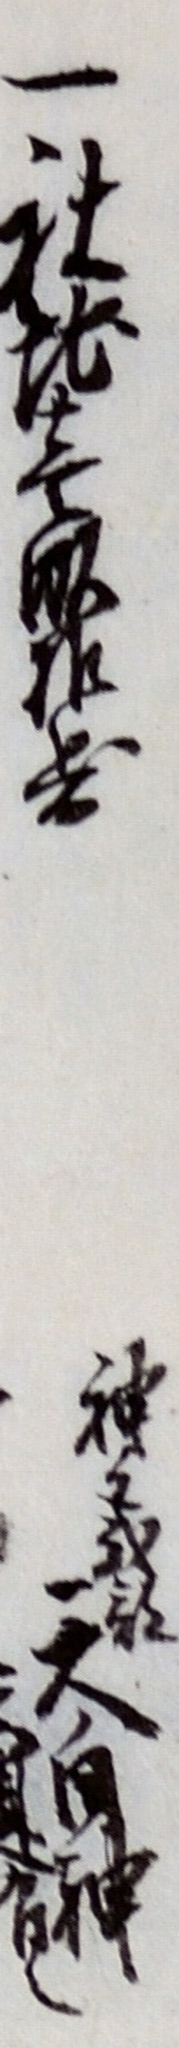一社地壱畝拾歩天白神
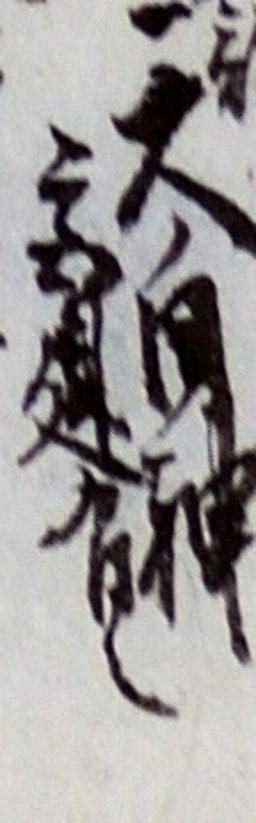宮建有之
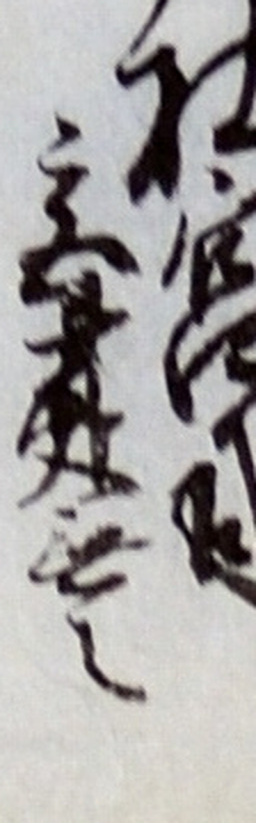宮建無之
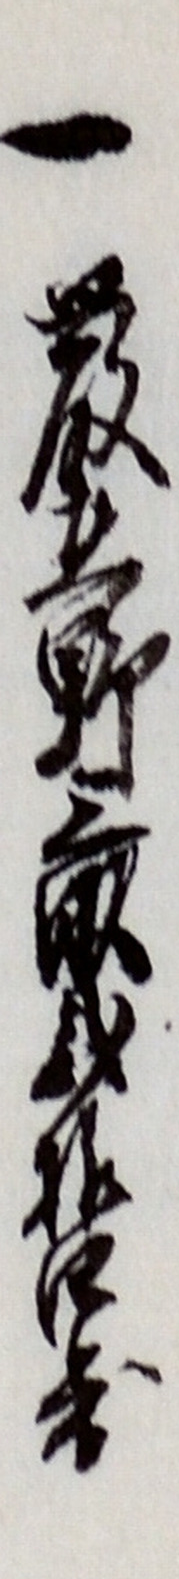一散在野三畝弐拾四歩
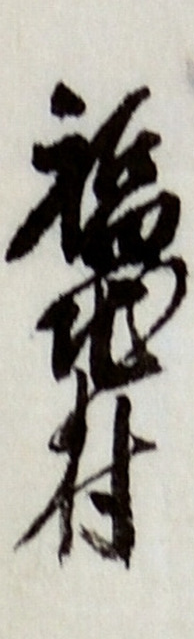福地村
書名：御領分中山林社地手控
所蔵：伊那市立高遠町図書館・合同会社AMANE
